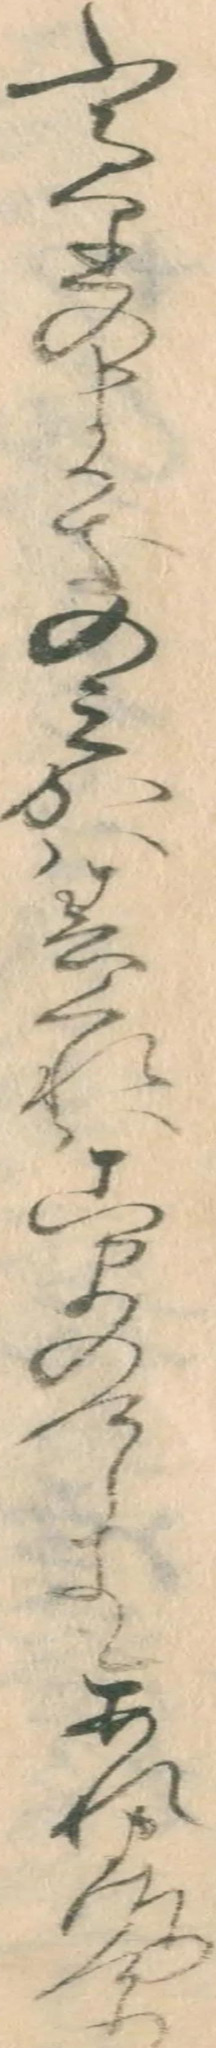ふる里のまかきのみかは春くれはこまのけしきもあれまさりけり

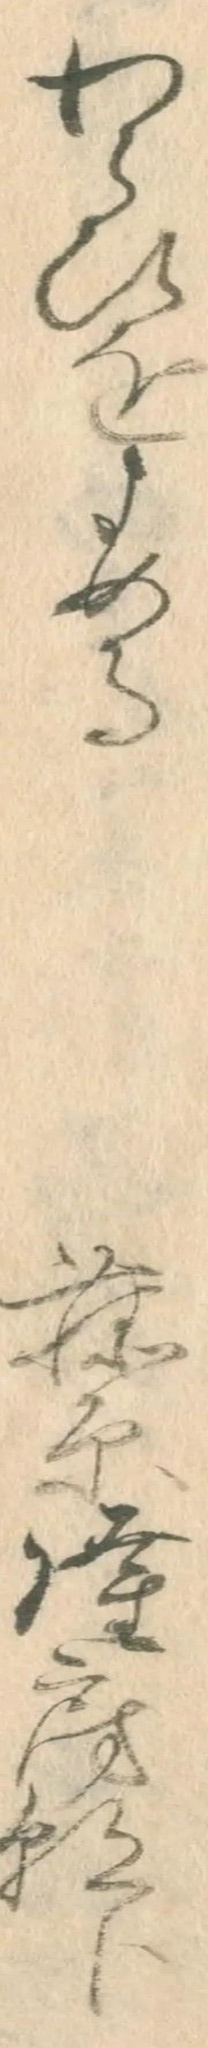わらひをよめる藤原隆房朝臣
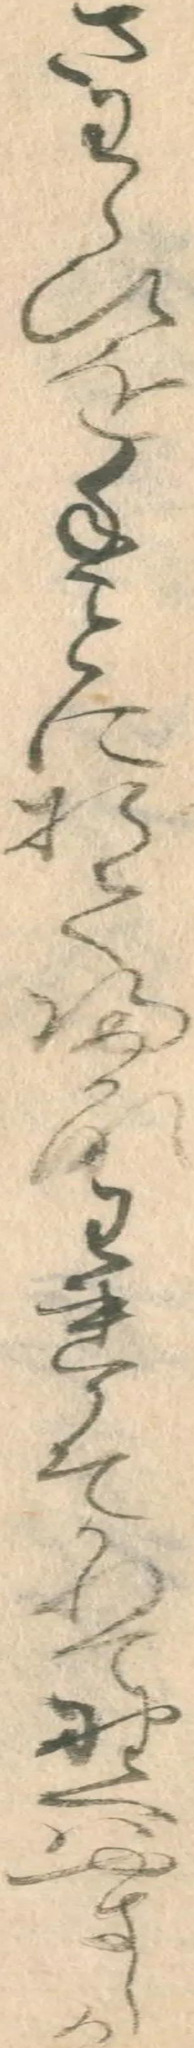さわらひを手ことに折て帰かなわれこそかねて野へはやきしか
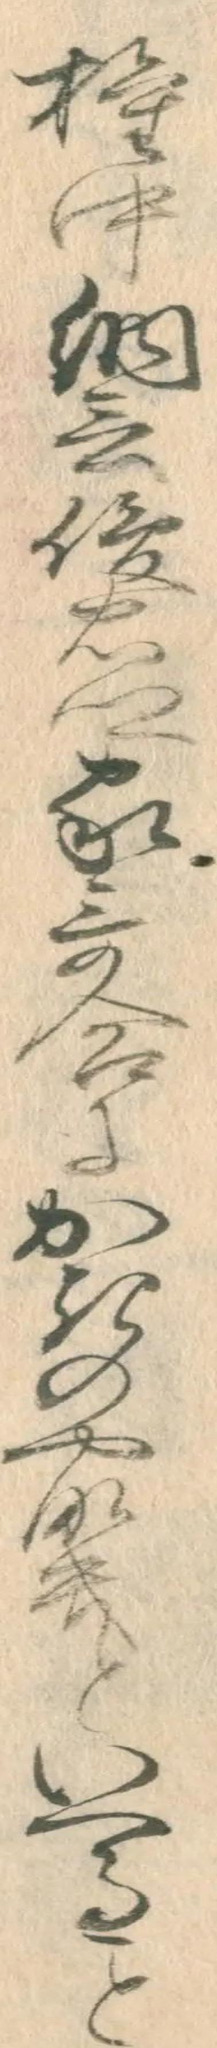権中納言俊忠卿家歌合にかきのやなきといへること
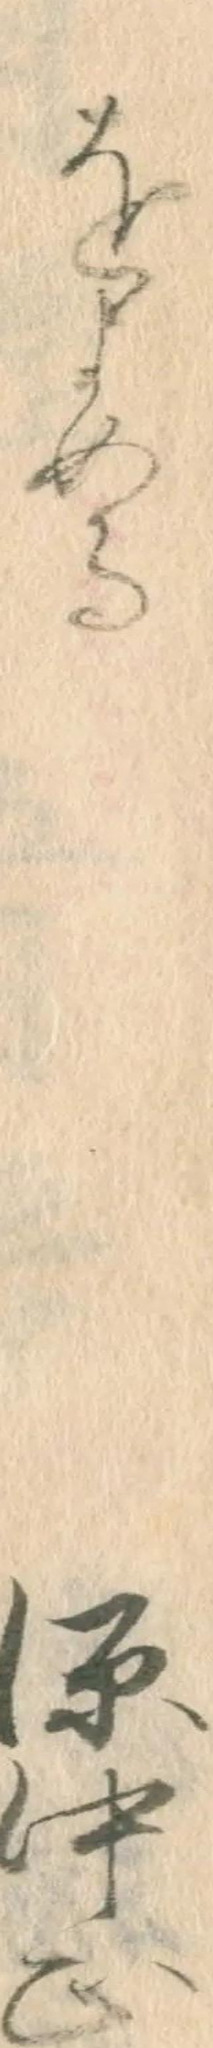をよめる源仲正
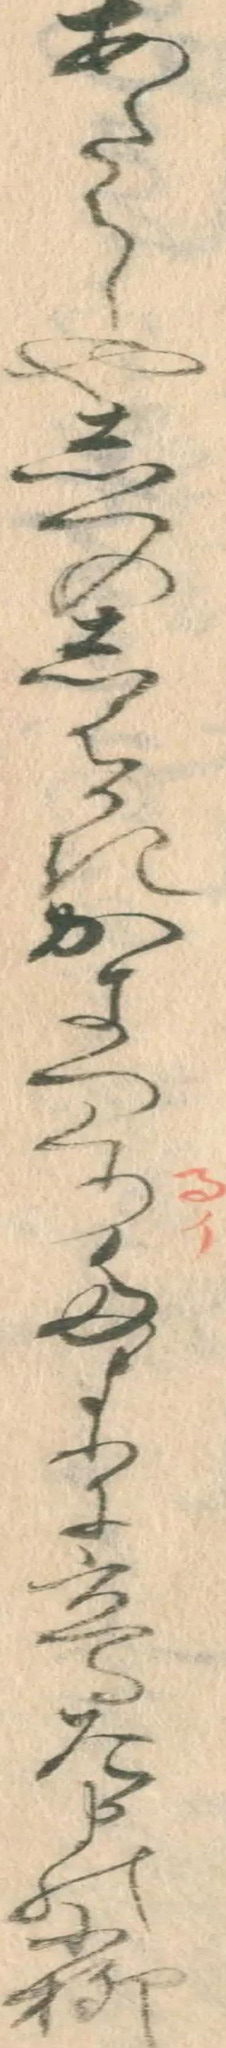あたらしやしつのしはかきかきつくりたよりに立るたまの小柳
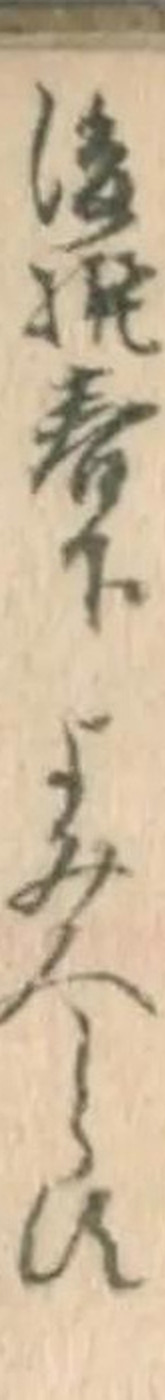後撰春下よみ人しらす
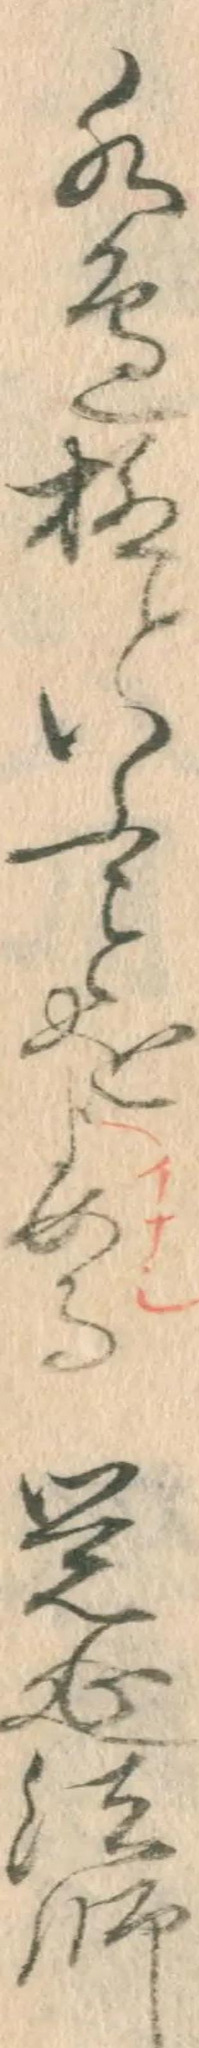水辺柳といふことをよめる覚延法師
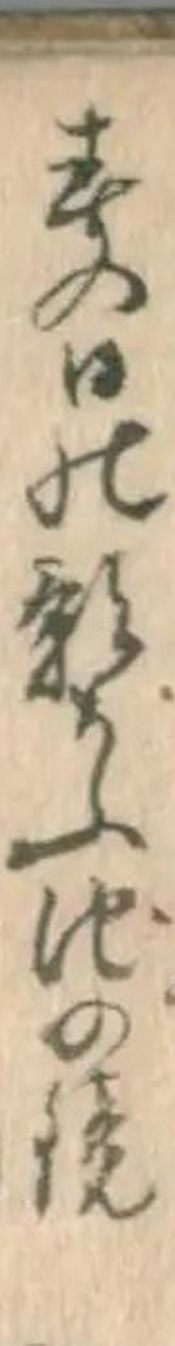春の日の影そふ池の鏡
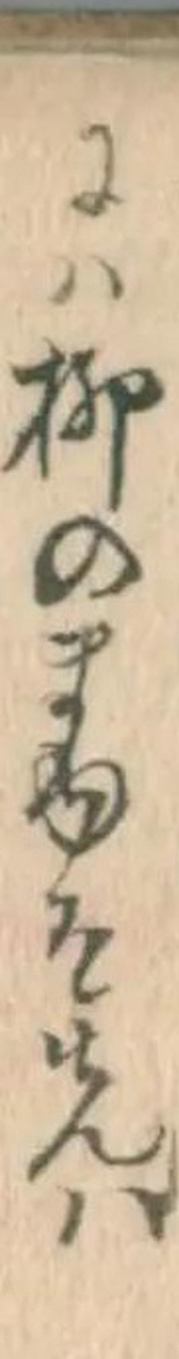には柳のまゆそ先は
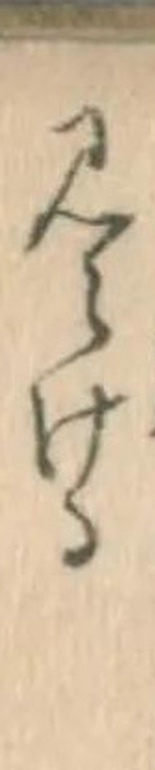見えける
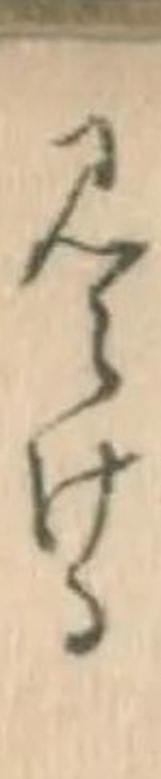見えける
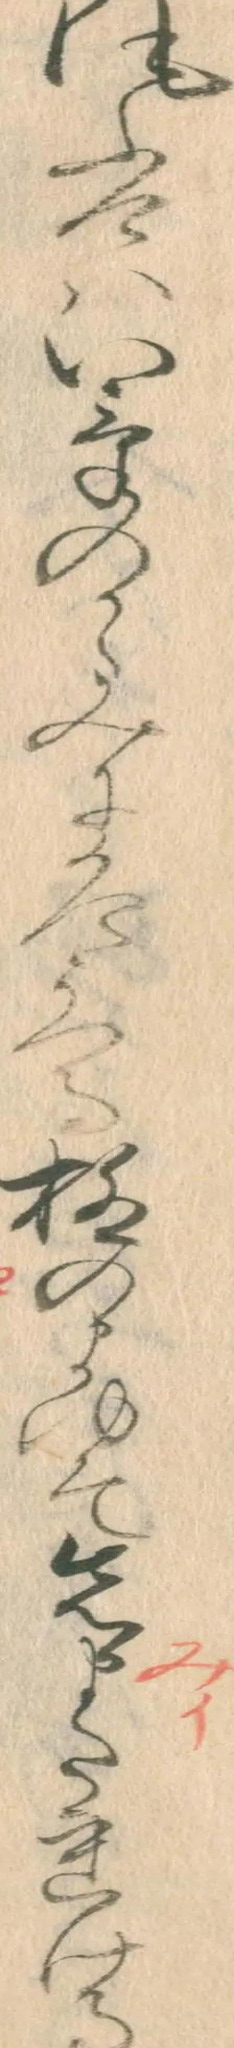風ふけはいけのかゝみにかけうつる柳のまゆそ先またれける
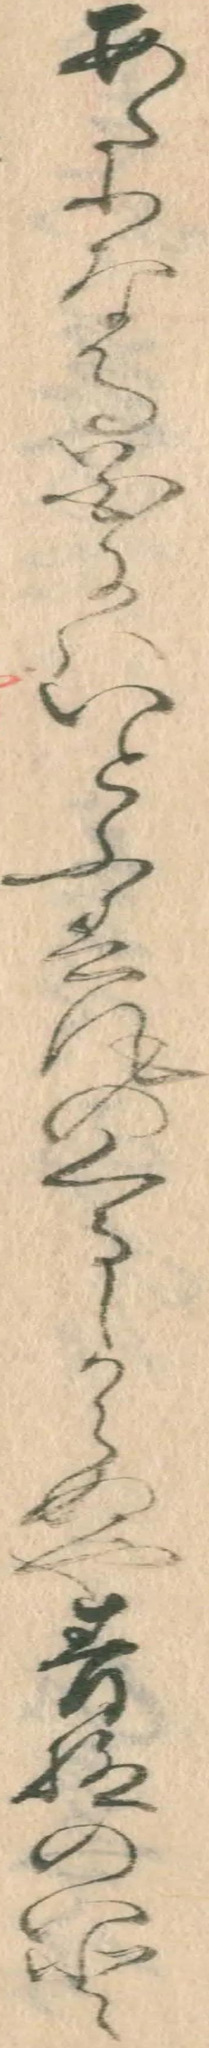あたりなる花にはいとふ春風のくるしからぬや青柳のいと
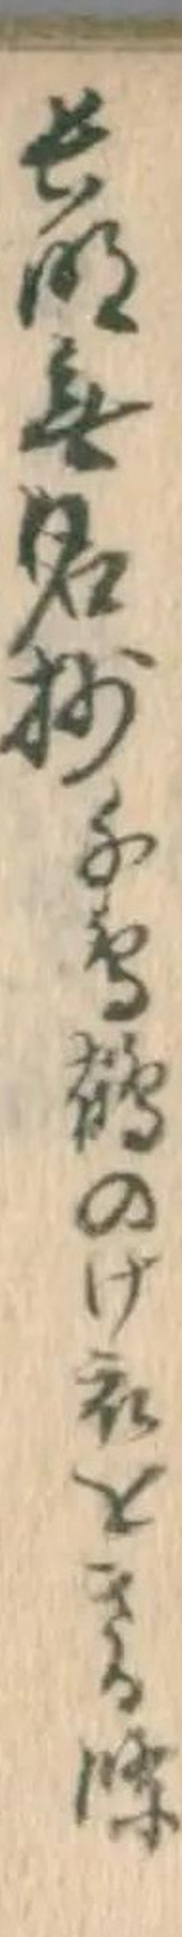長明無名抄千鳥鶴のけ衣をきる条
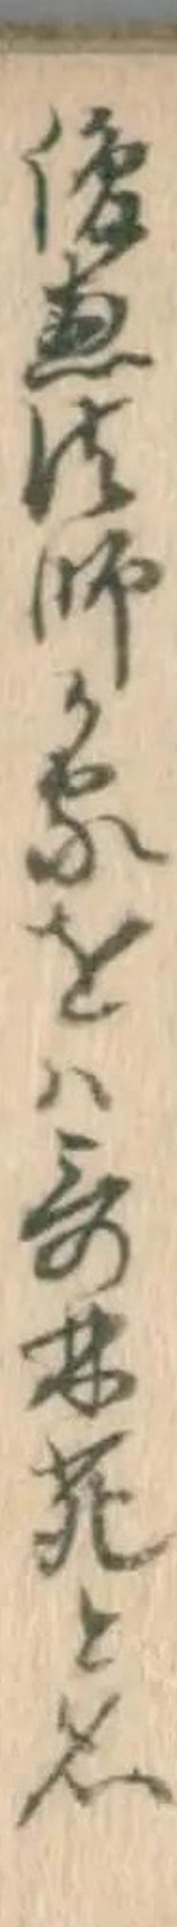俊恵法師か家をは歌林苑と名
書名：月詣和歌集
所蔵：国立国会図書館 National Diet Library, JAPAN
